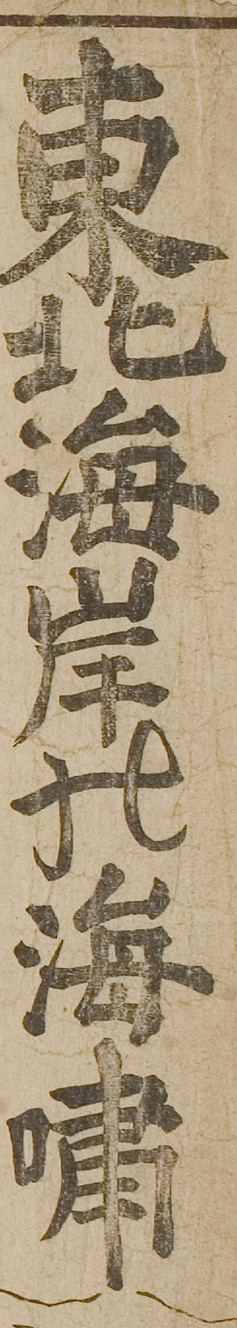東北海岸の海嘯
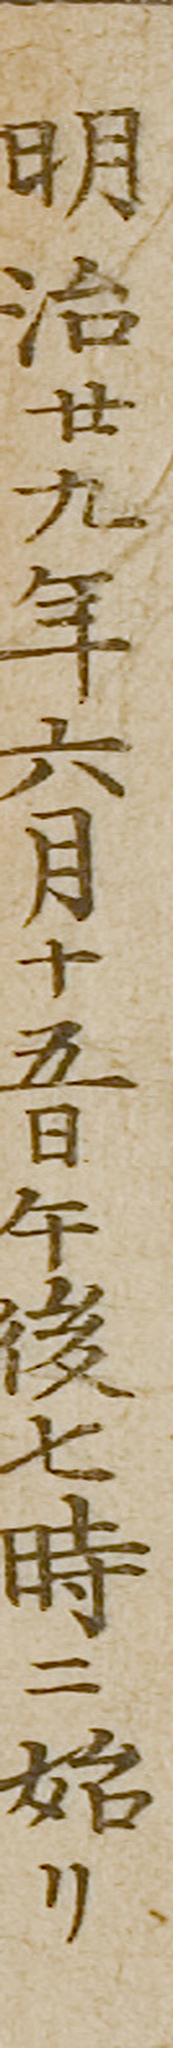明治廿九年六月十五日午後七時に始り
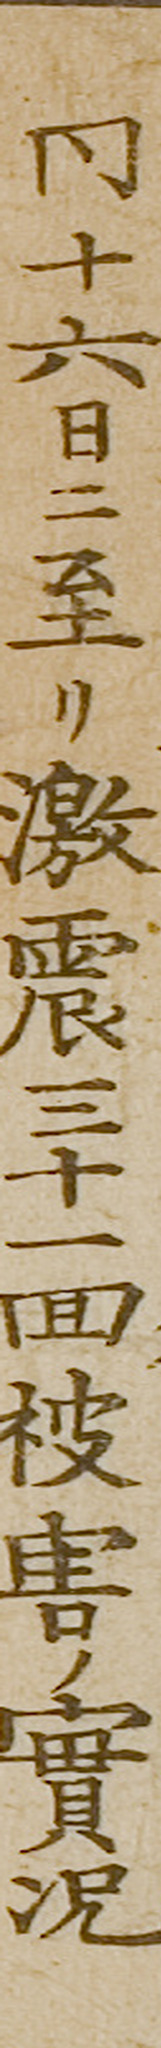同十六日に至り激震三十一回被害の實況
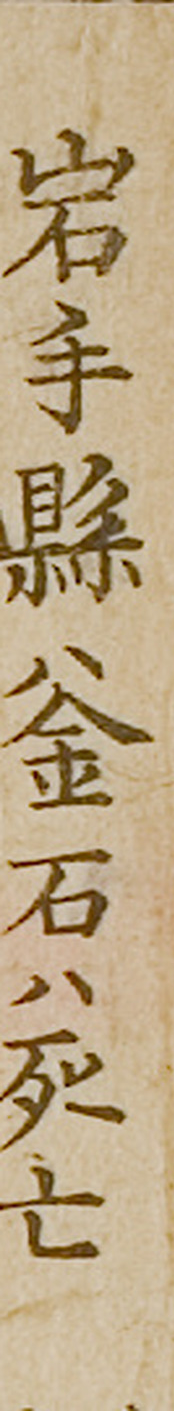岩手縣釜石は死亡
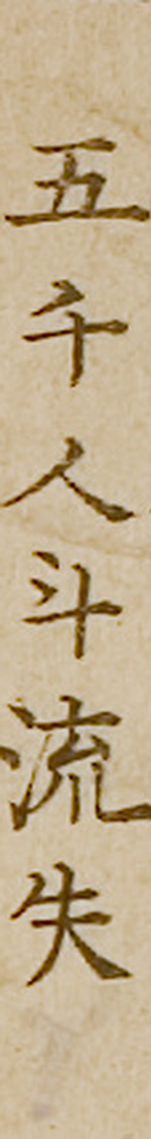五千人斗流失
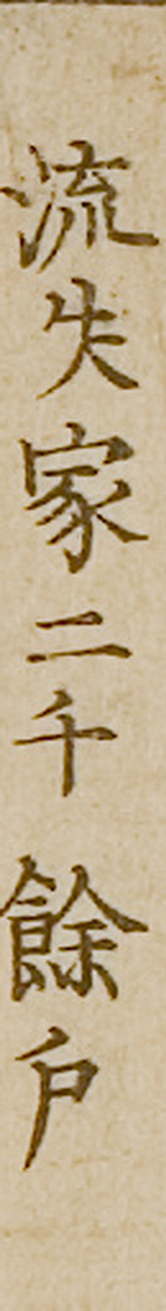流出家二千餘戸
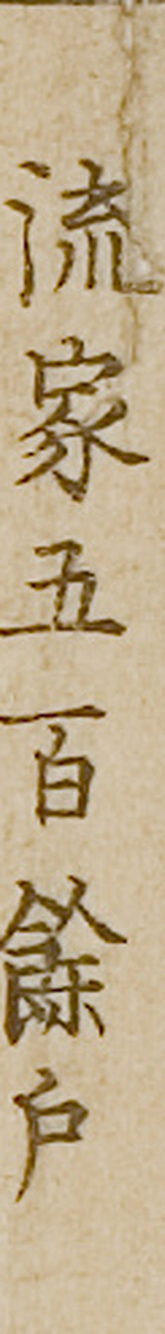流家五百餘戸
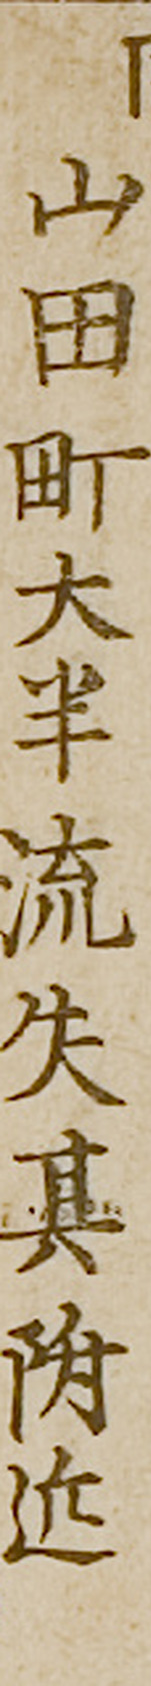同山田町大半流失其附近
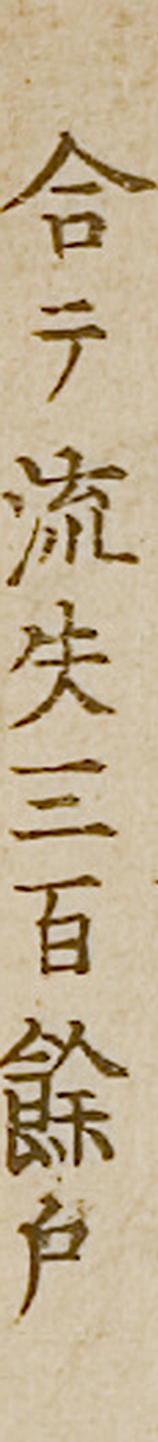合て流失三百餘戸
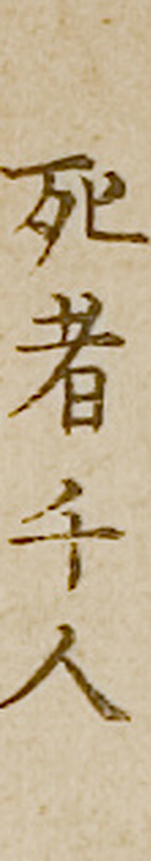死者千人
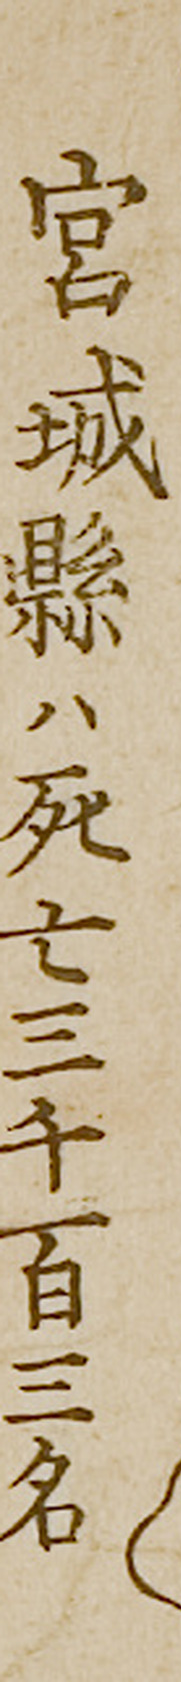宮城縣は死亡三千百三名
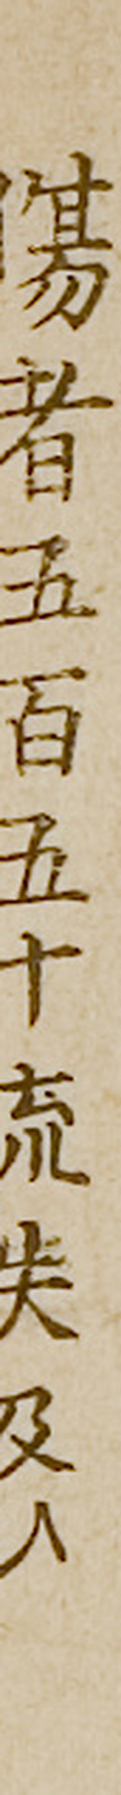傷者五百五十流失及ひ
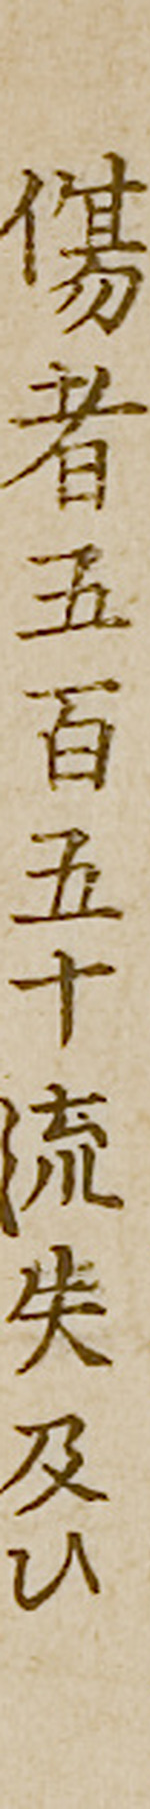傷者五百五十流失及ひ
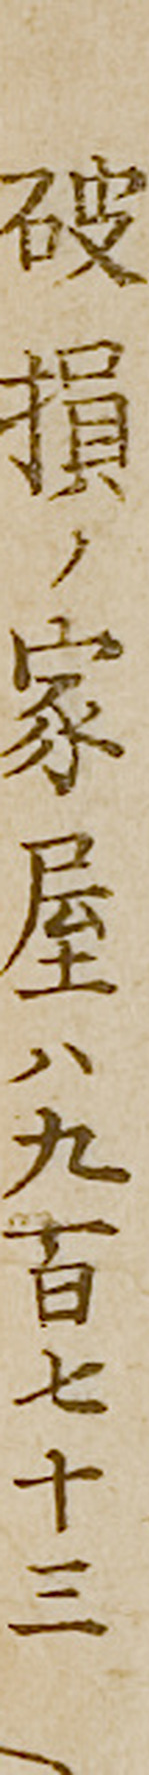破損の家屋は九百七十三
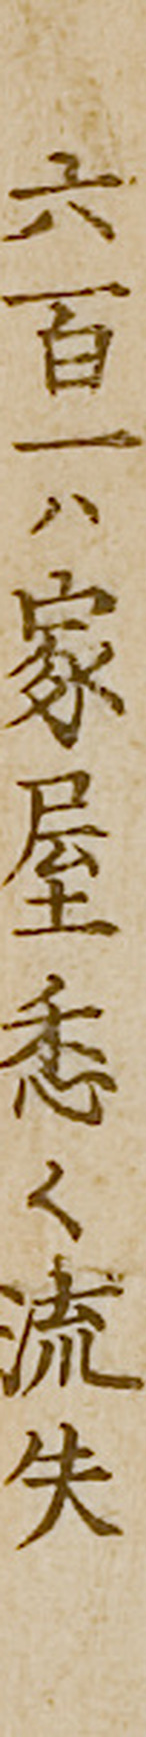六百一は家屋悉く流失
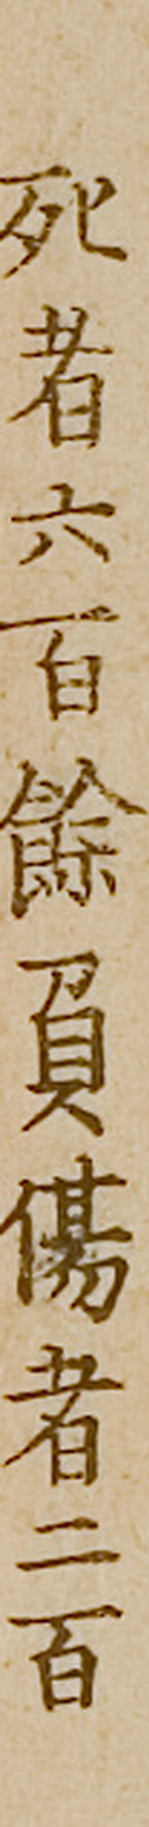死者六百餘負傷者二百
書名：東北海岸の海嘯
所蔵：東京大学総合図書館 General Library in the University of Tokyo, JAPAN
